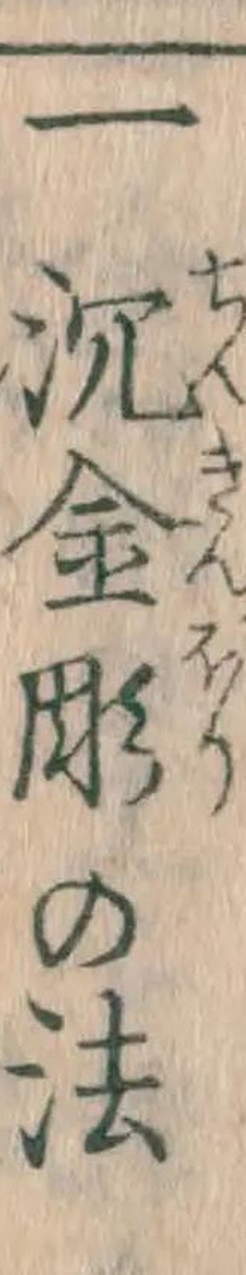一沈金彫の法
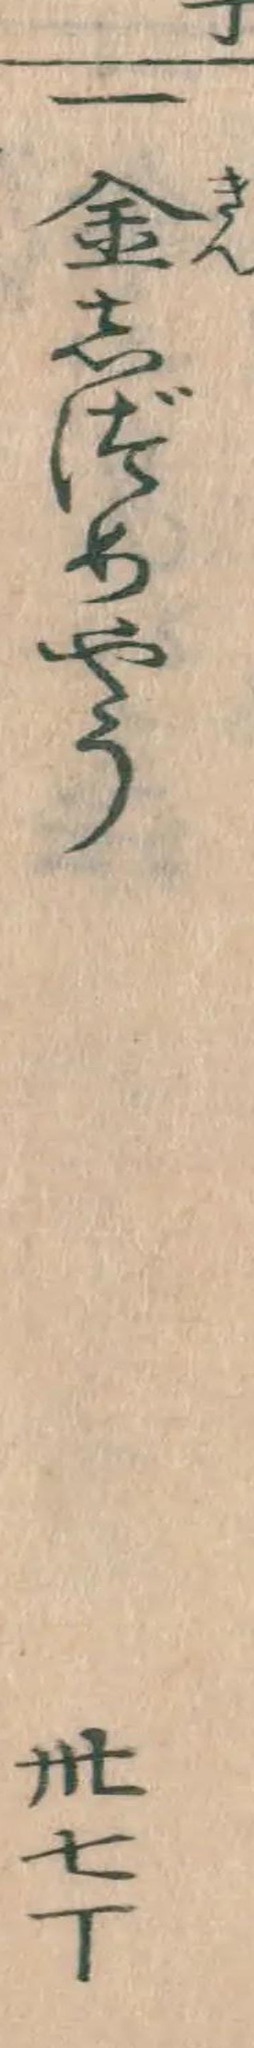一金しづめやう卅七丁
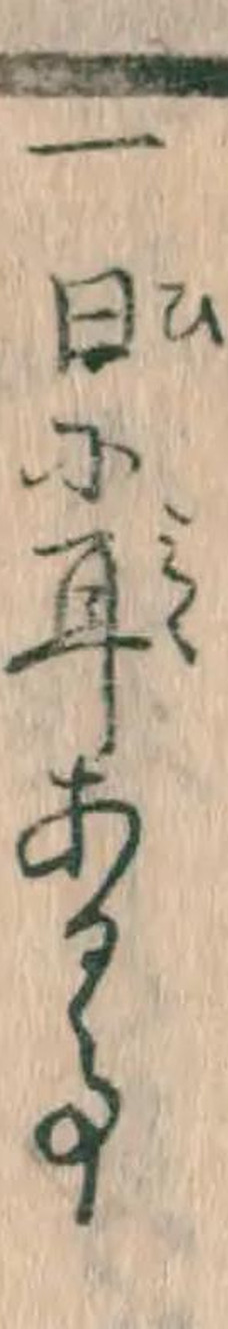一日に耳ある事
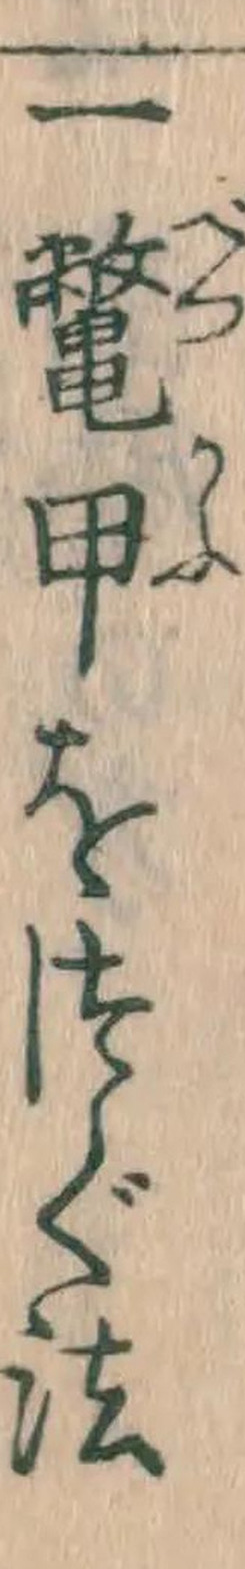一鼈甲をつぐ法
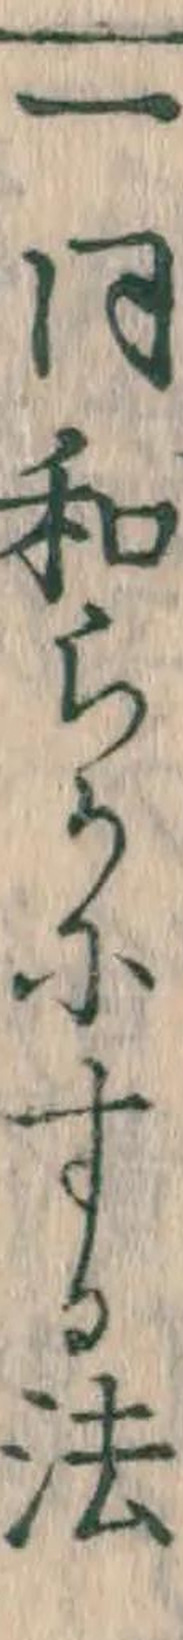一同和らかにする法
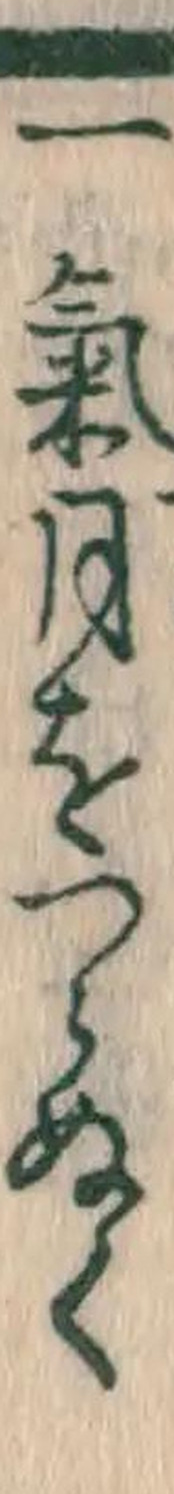一気月をつらぬく
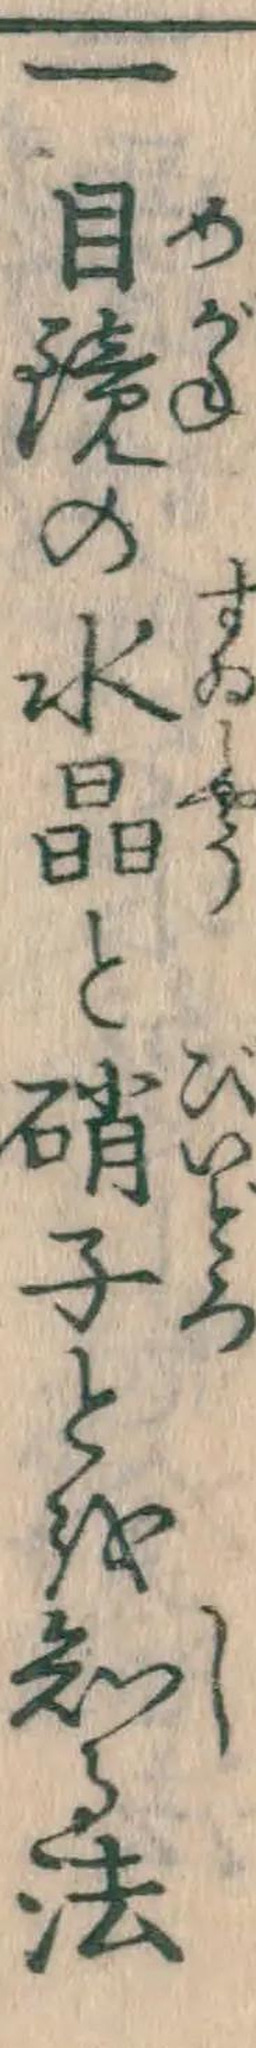一目鏡の水晶と硝子とを知る法
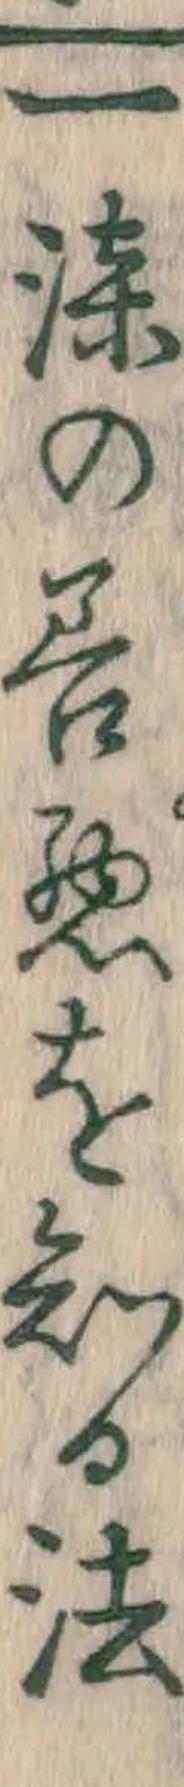一漆の善悪を知る法
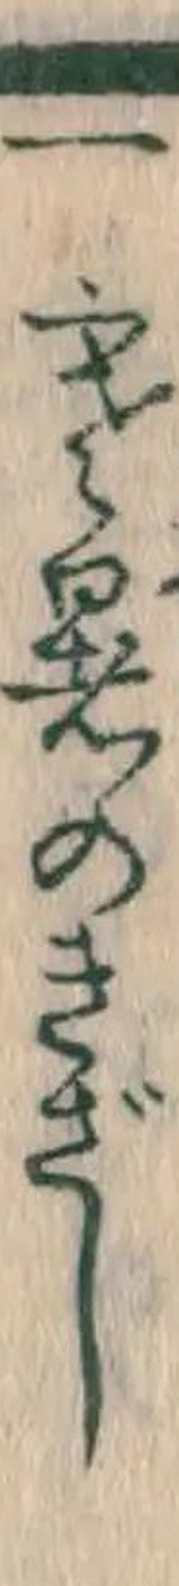一寒暑のきざし
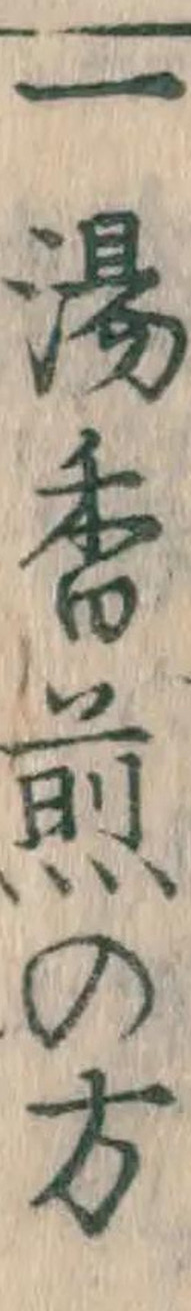一湯香煎の方
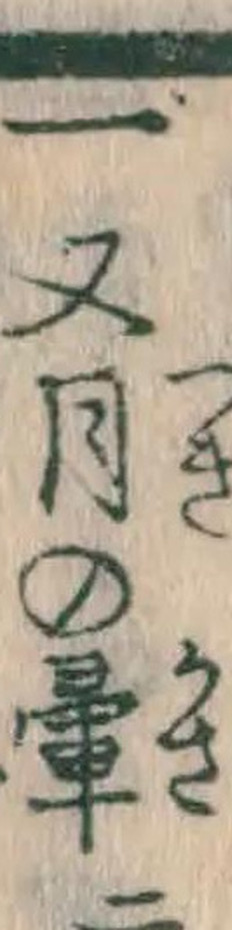一月の暈
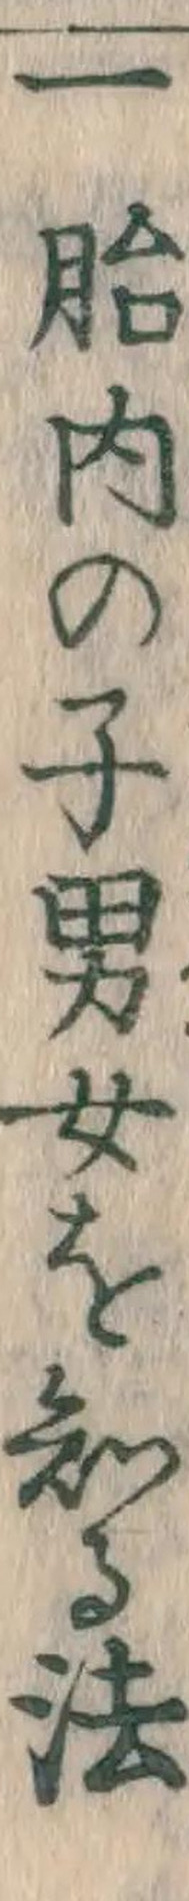一胎内の子男女を知る法
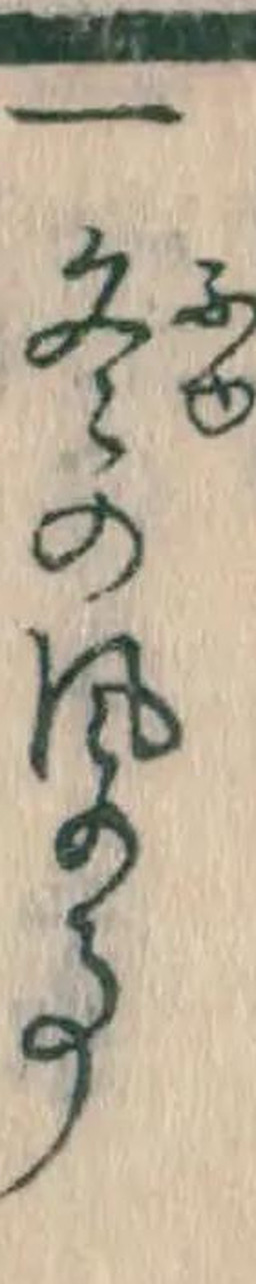一南風の事
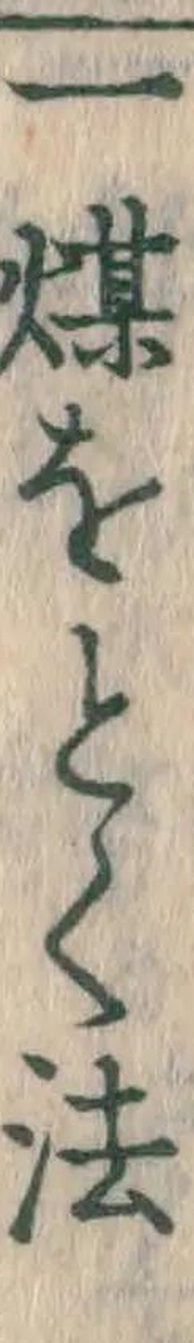一煤をとく法
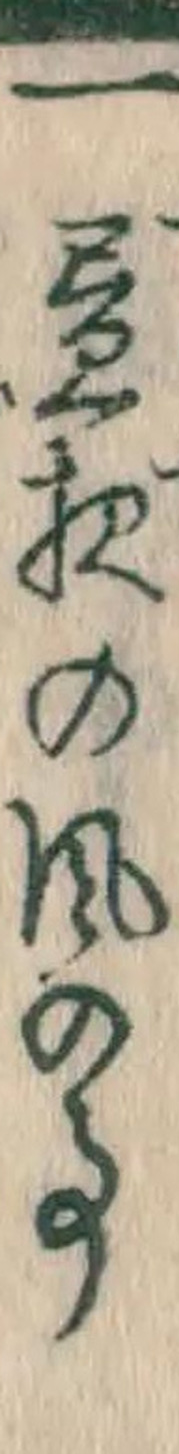一昼夜の風の事
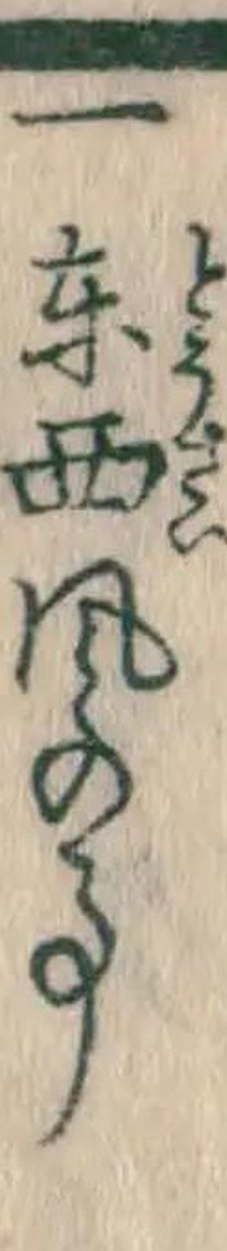一東西風の事
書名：広益秘事大全 3巻. [1]
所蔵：国立国会図書館 National Diet Library, JAPAN
